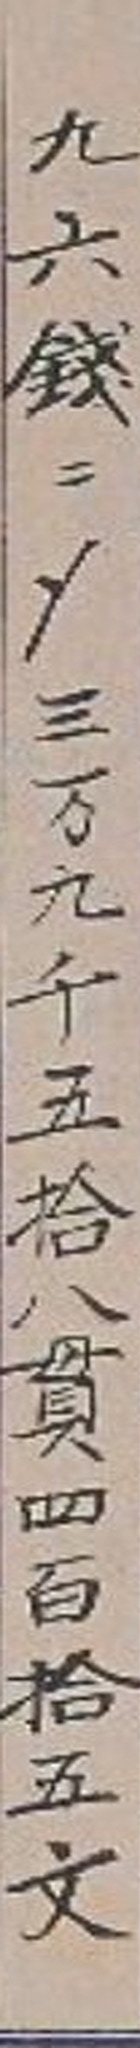九六錢ニシテ三万九千五拾八貫四百拾五文
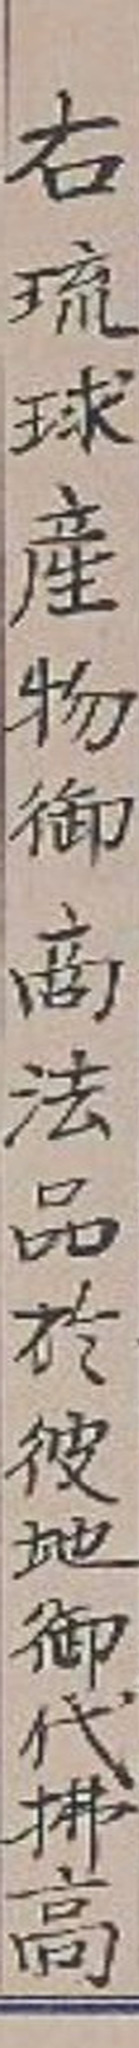右琉球産物御商法品於彼地御代拂高
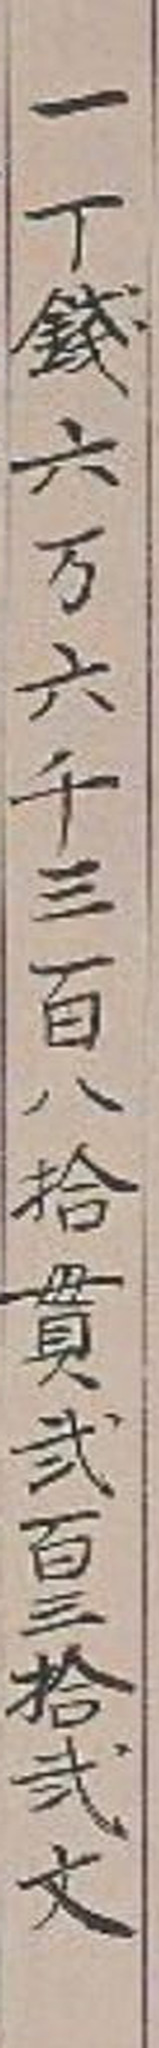一丁錢六万六千三百八拾貫弐百三拾弐文
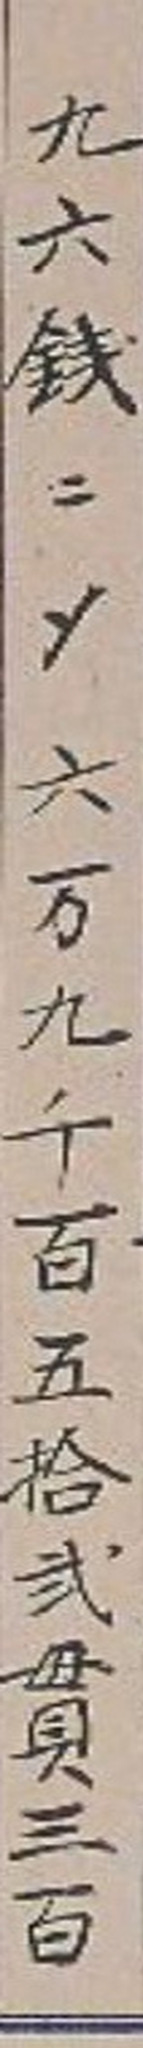九六銭ニシテ六万九千百五拾弐貫三百
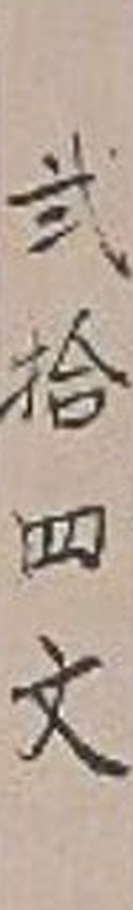弐拾四文
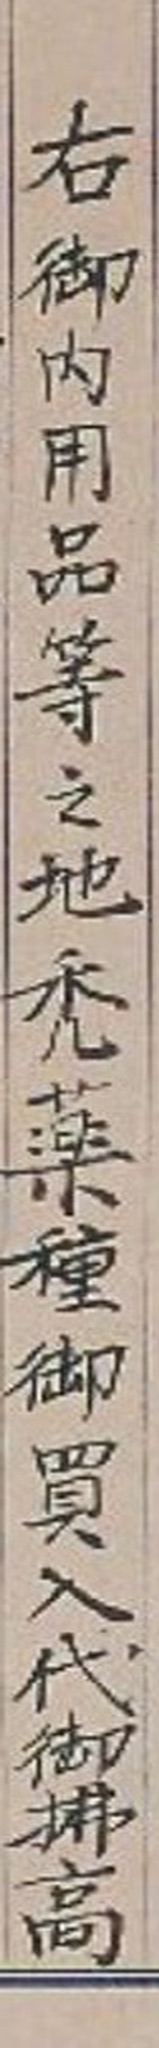右御内用品等之地禿薬種御買入代御拂高
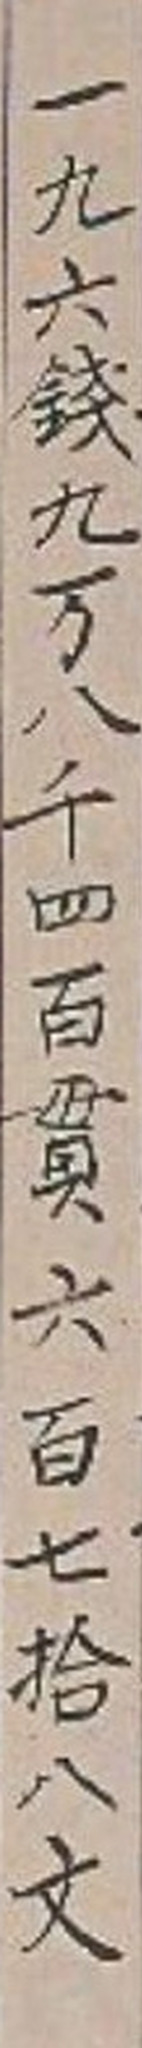一九六錢九万八千四百貫六百七拾八文
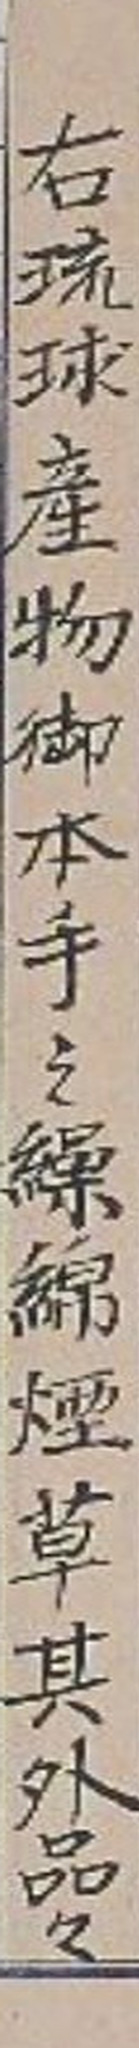右琉球産物御本手之繰綿煙草其外品々
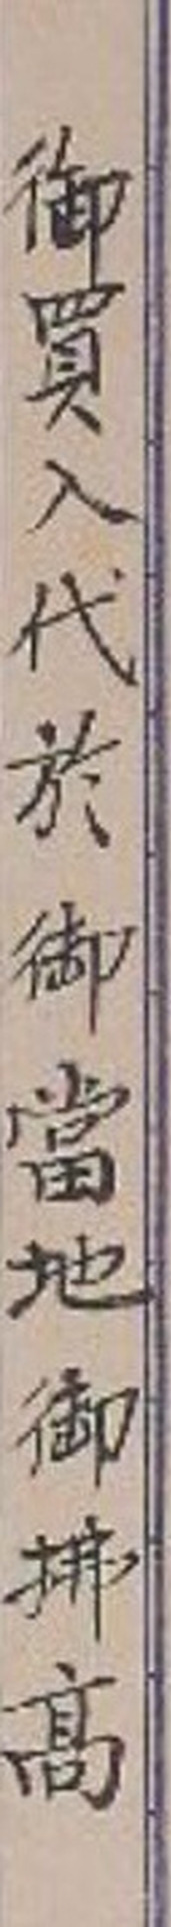御買入代於御當地御拂髙
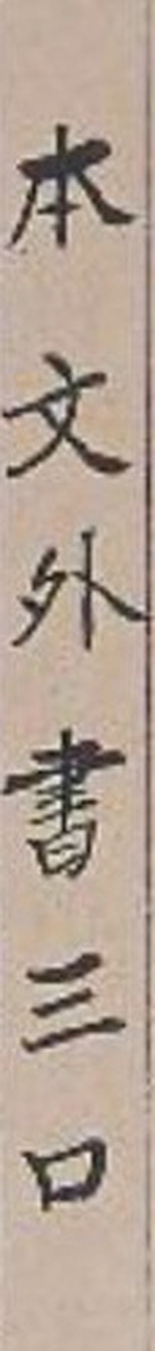本文外書三口
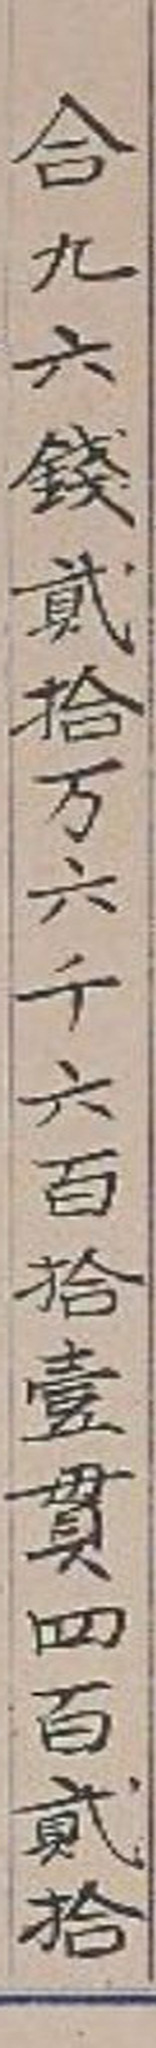合九六錢貳拾六千六百拾壹貫四百貳拾

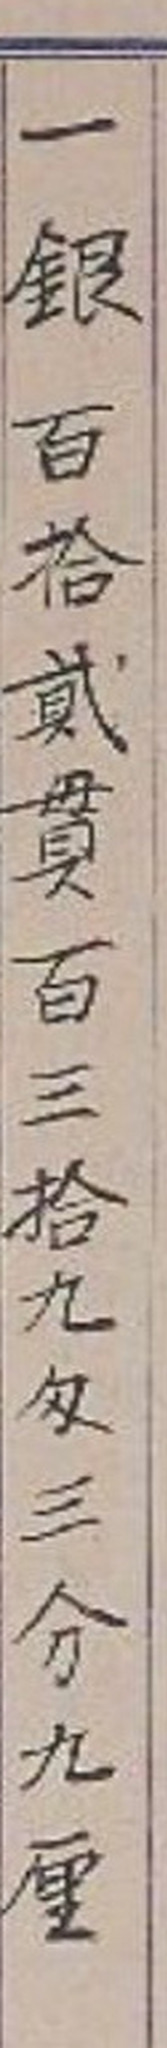一銀百拾貳貫百三拾九匁三分九厘
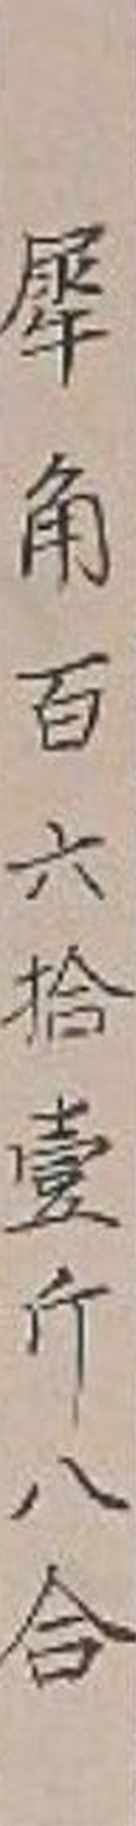犀角百六拾壹斤八合
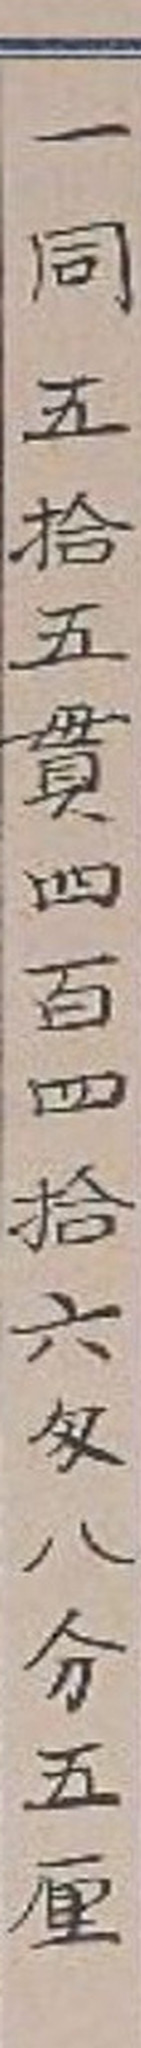一同五拾五貫四百四拾六匁八分五厘
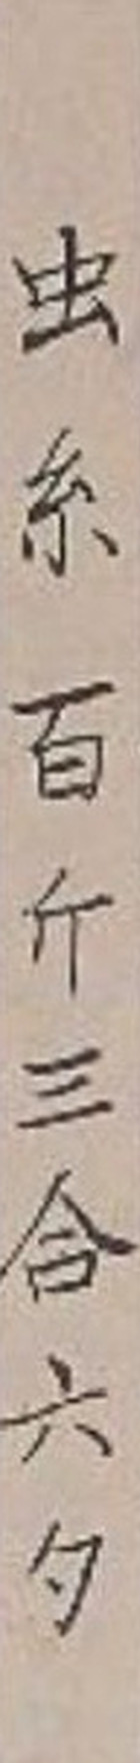虫糸百斤三合六勺
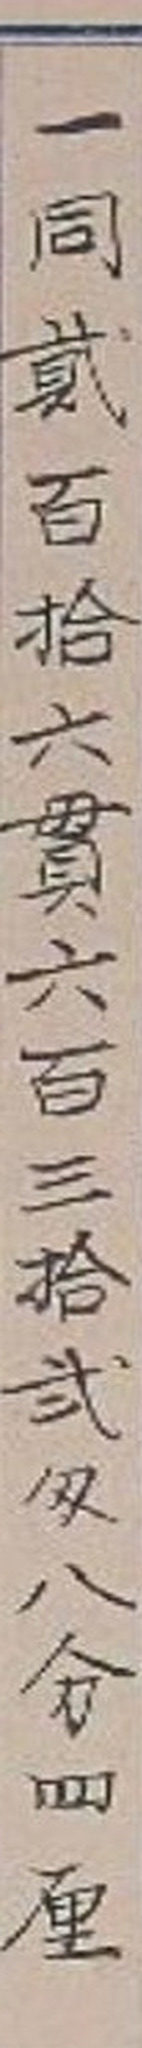一同貳百拾六貫六百三拾弐匁八分四厘
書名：琉球産物於長崎拂立並本手品利潤総帖 弘化四年より酉年迄
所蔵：University of the Ryukyus Library
